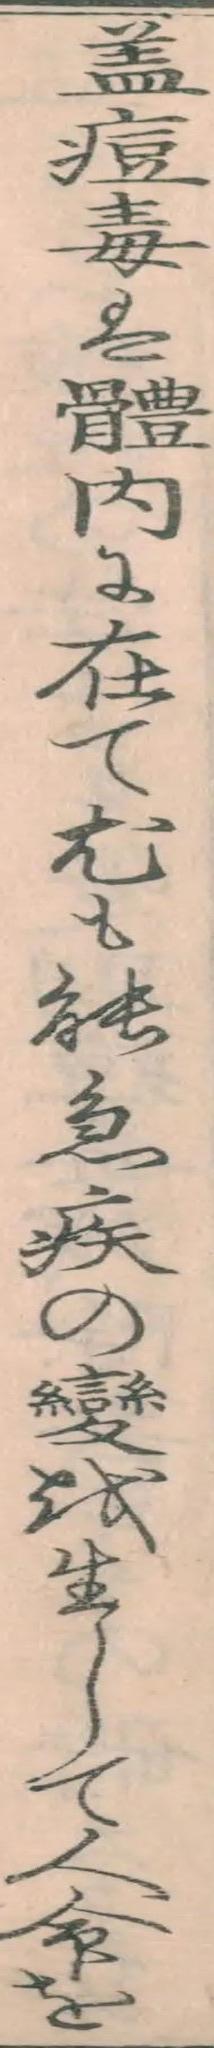盖痘毒は體内に在て尤も能急疾の變を生して人命を
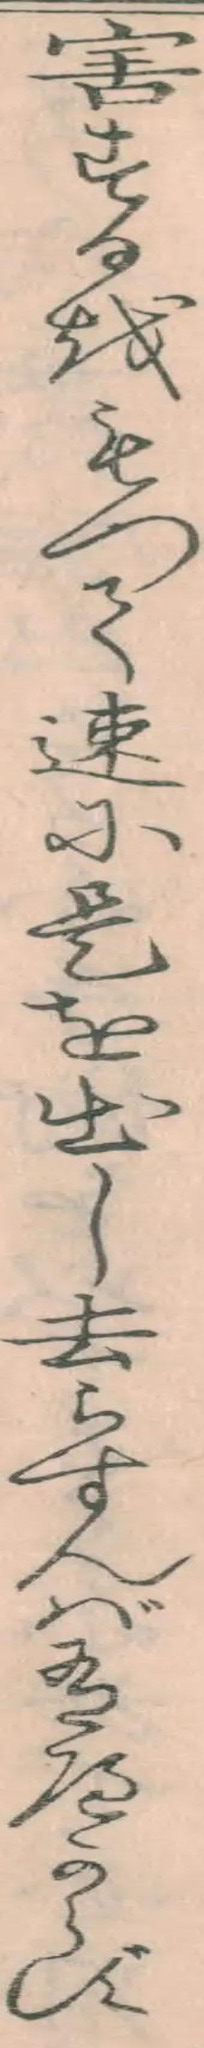害するをもつて速に是を出し去らすんば有へからず
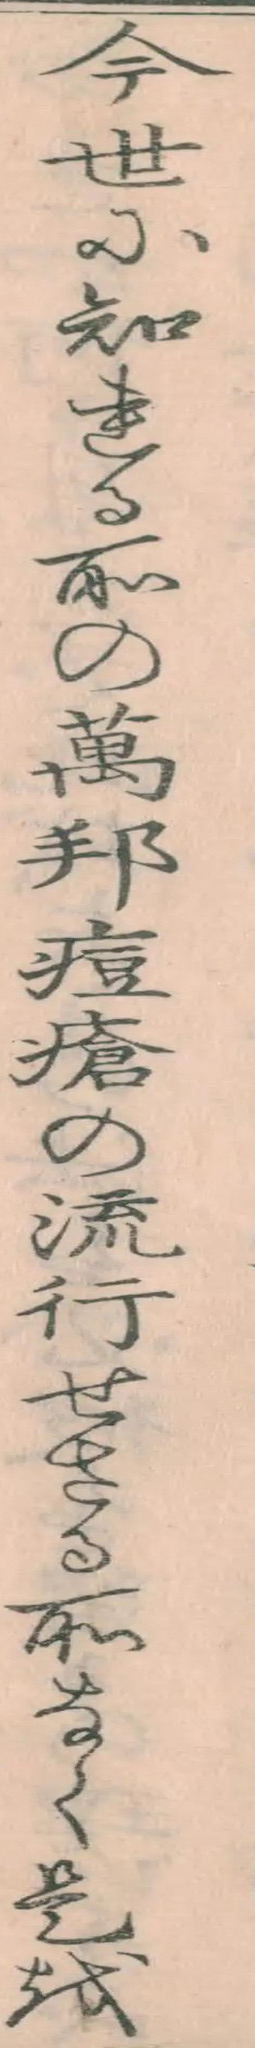今世に知れる所の萬邦痘瘡の流行せさる所なく是を
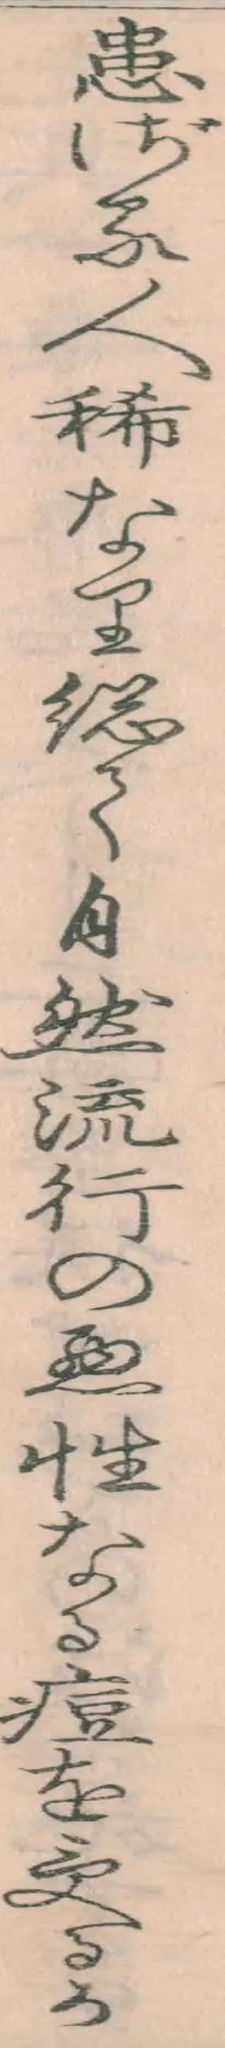患ずる人稀なり總て自然流行の悪性なる痘を受るか
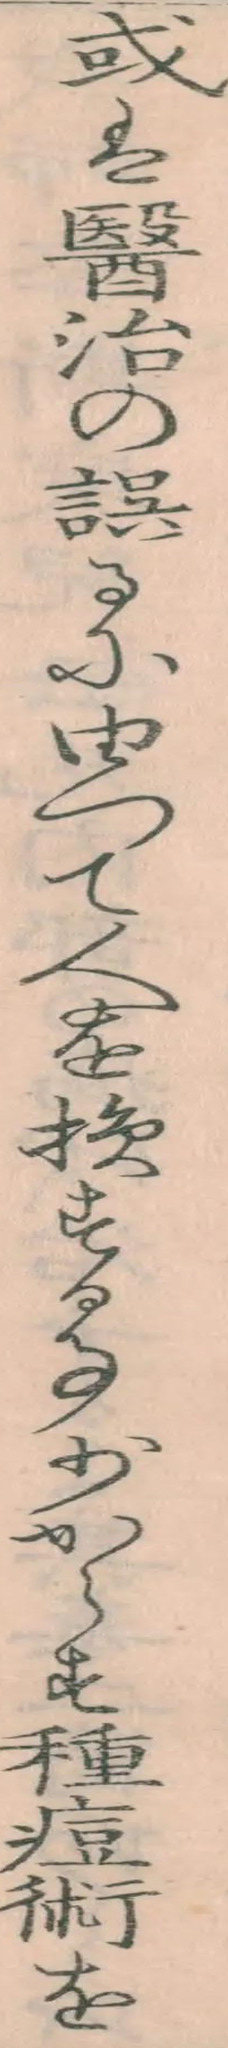或は醫治の誤るに由つて人を損する事少からす種痘術を
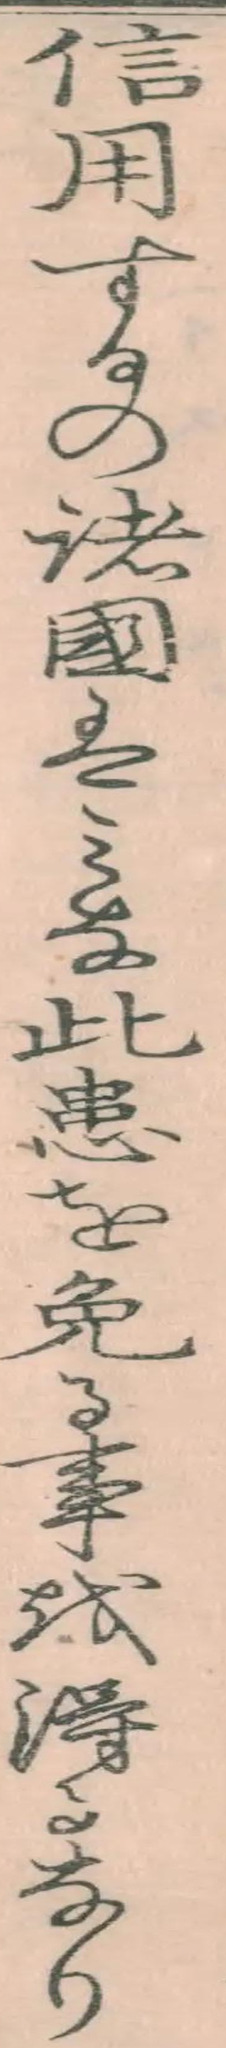信用するの諸国はみな此患を免る事を得るなり
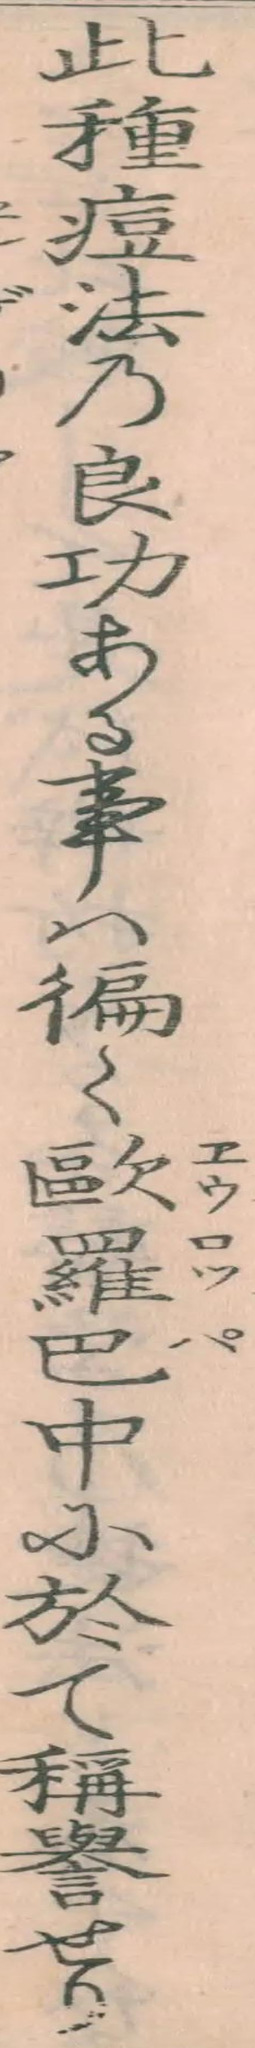此種痘法の良功ある事は徧く歐羅巴中に於て稱誉せり
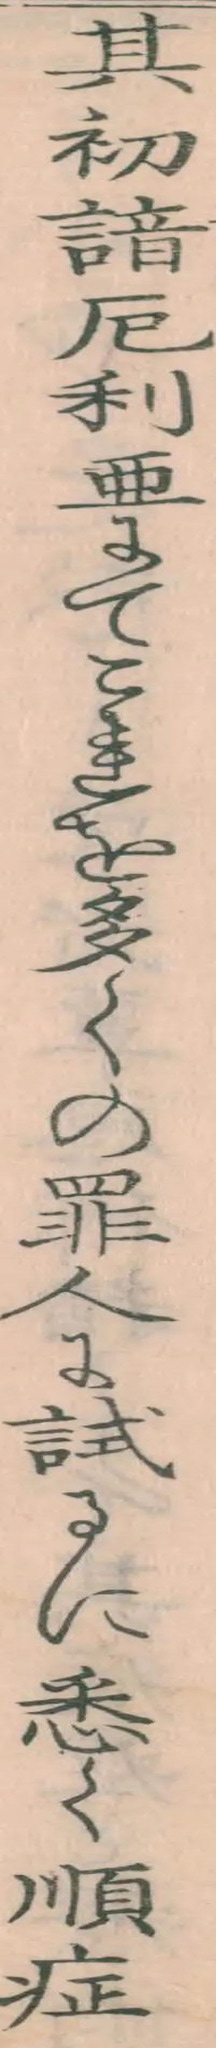其初諳厄利亜にてこれを多くの罪人に試るに悉く順症
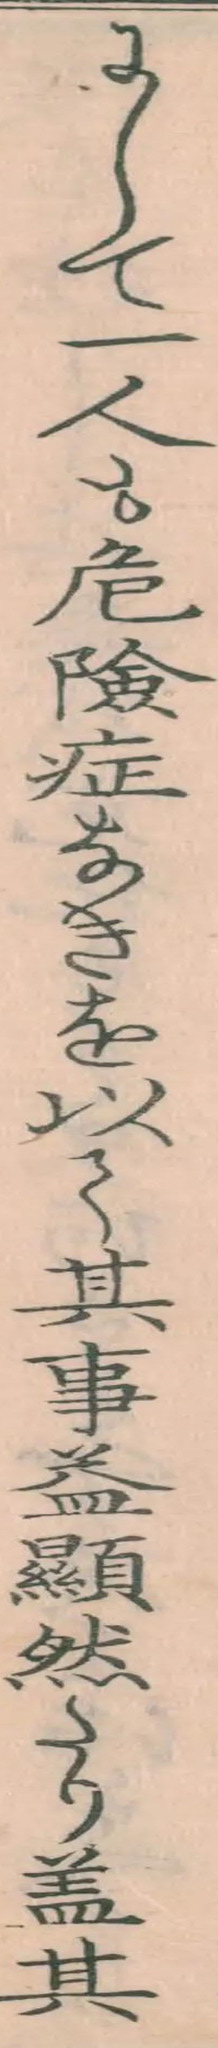にして一人も危険症なきを以て其事益顯然たり盖其
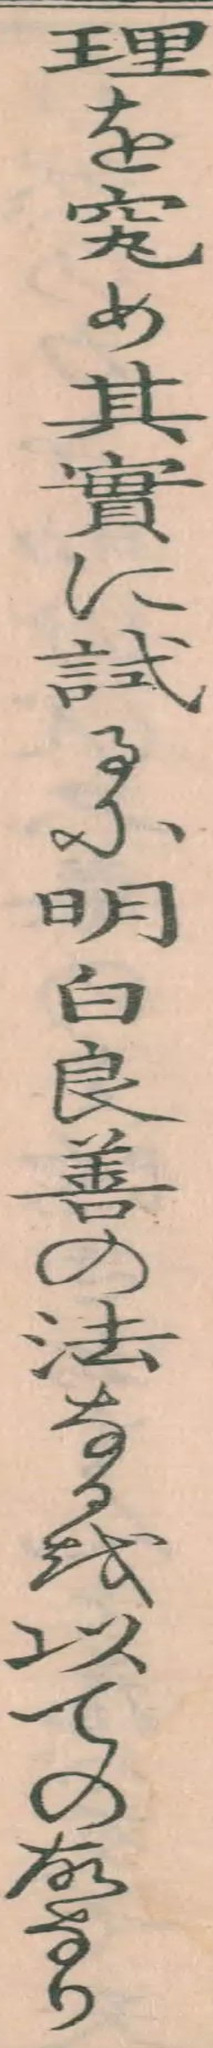理を究め其實に試るに明白良善の法なるを以ての故なり
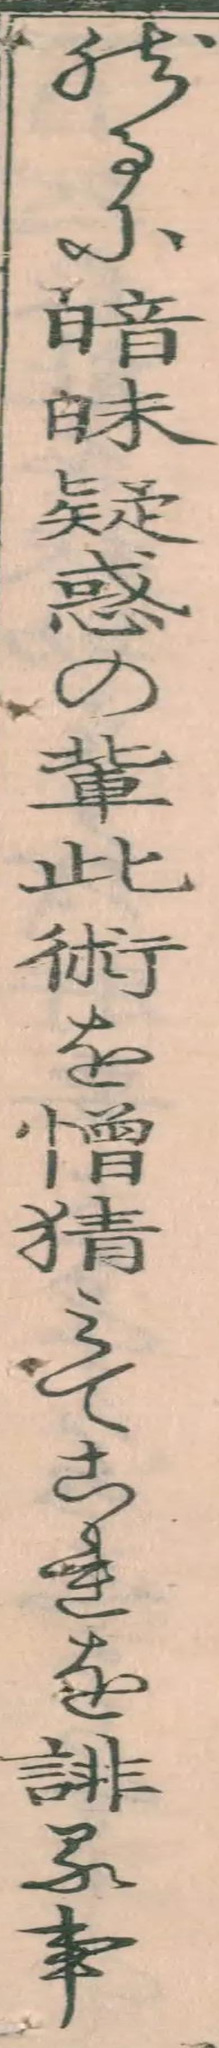然るに暗昧疑惑の輩此術を憎猜みてこれを誹る事
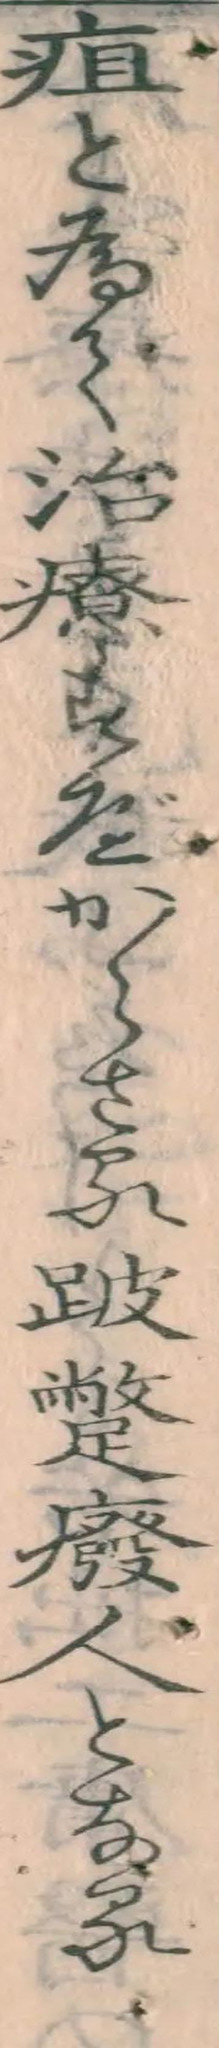疽と為て治療すべからさる跛蹩廃人となる
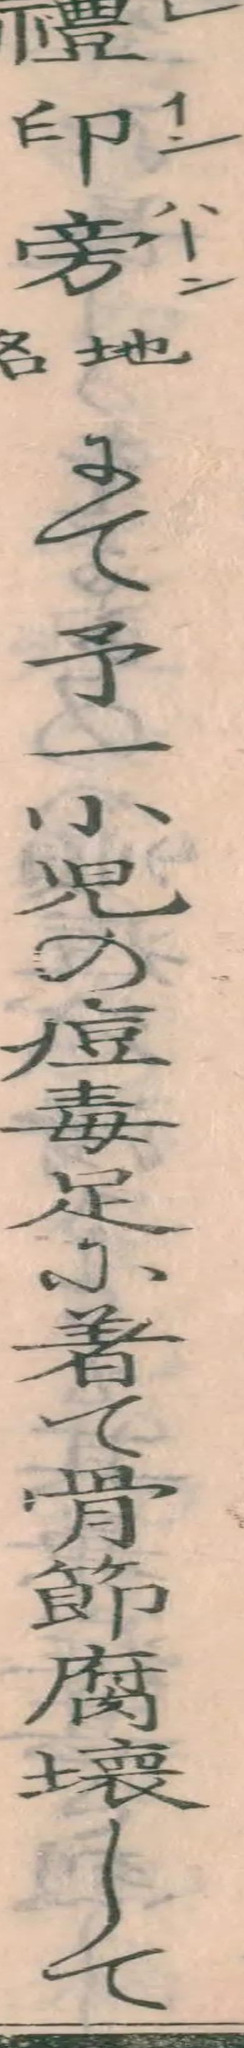禮印旁地名にて一小児の痘毒足に着て骨節腐壊して
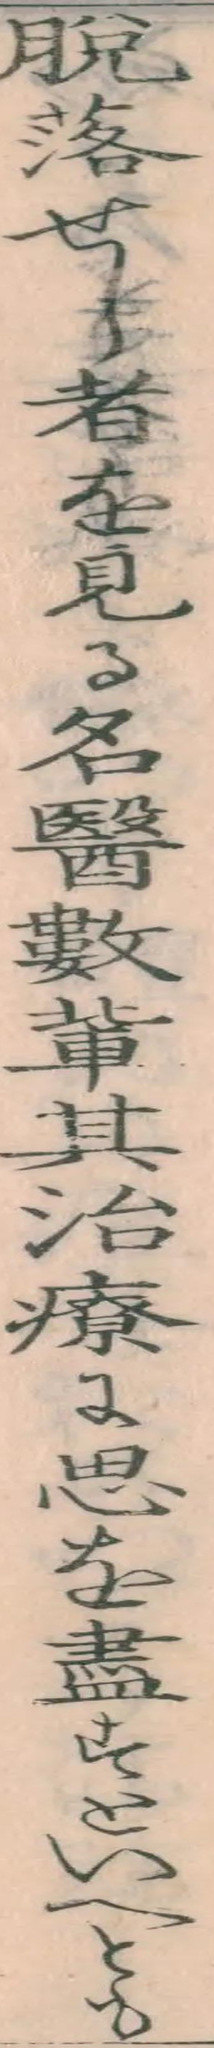脱落せし者を見る名醫數輩其治療に思を盡すといへとも
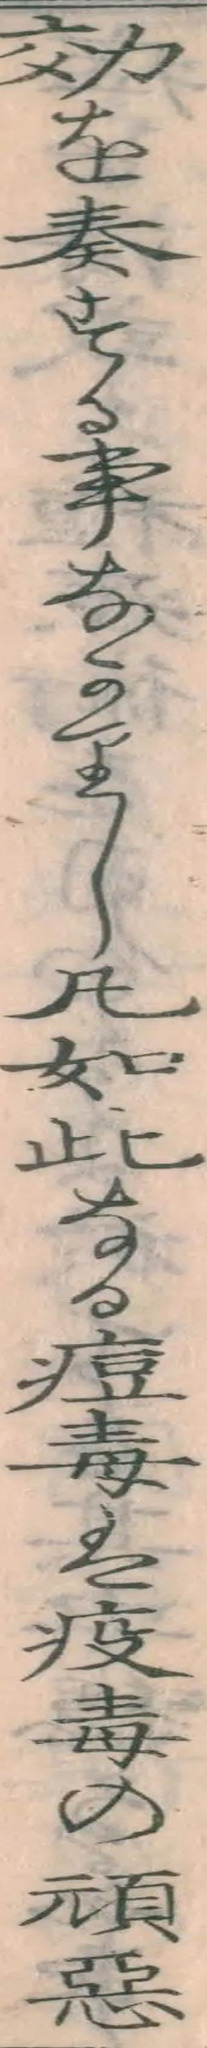効を奏する事なかりし凡如此なる痘毒は疫毒の頑惡
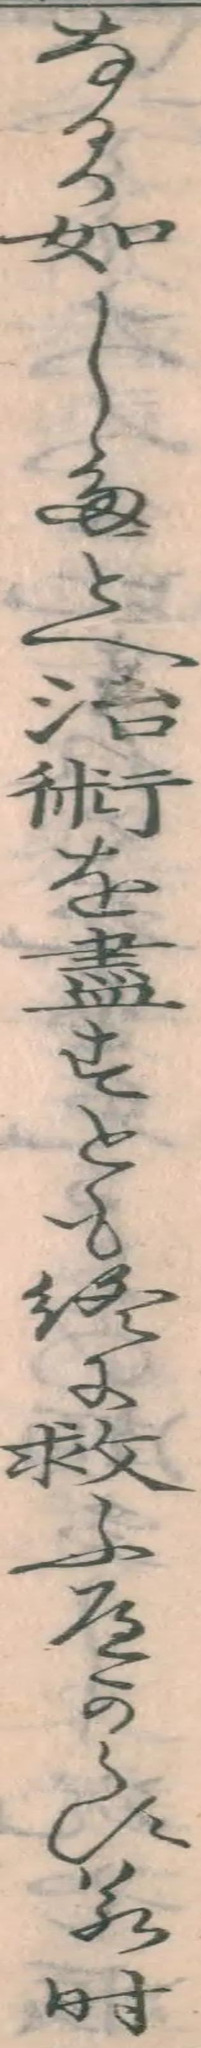なるか如したとへ治術を盡すとも終に救ふべからす其時
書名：種痘新編
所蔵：国立国会図書館 National Diet Library, JAPAN
